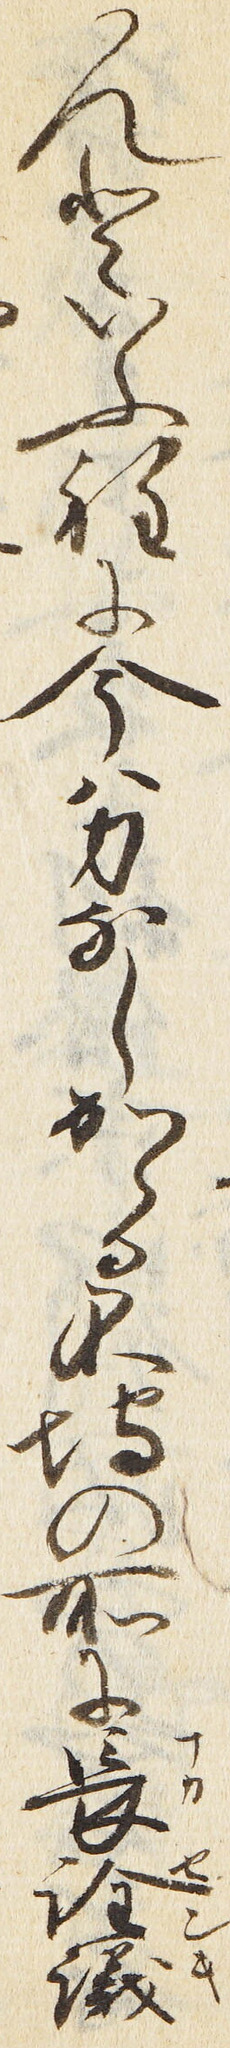んといふ程に今ハ力なしかる不埒の所に長詮議
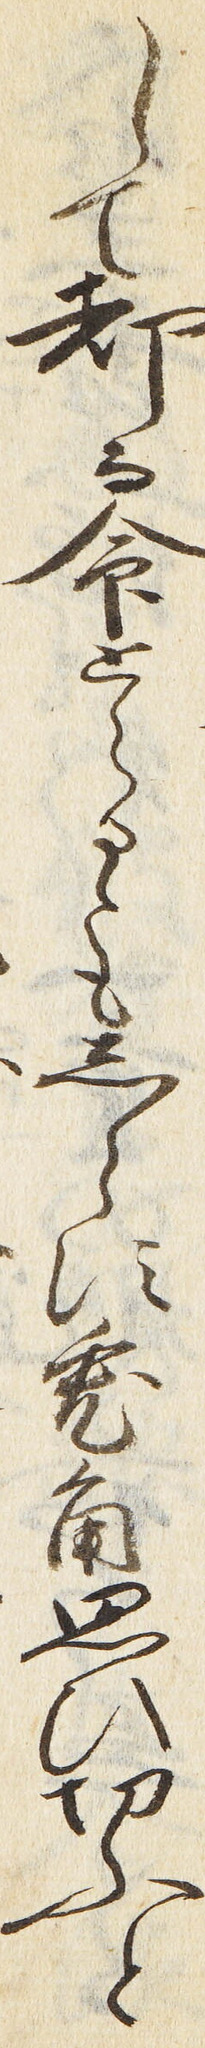して却而命とらるゝもしらす兎角思ひ切ふと
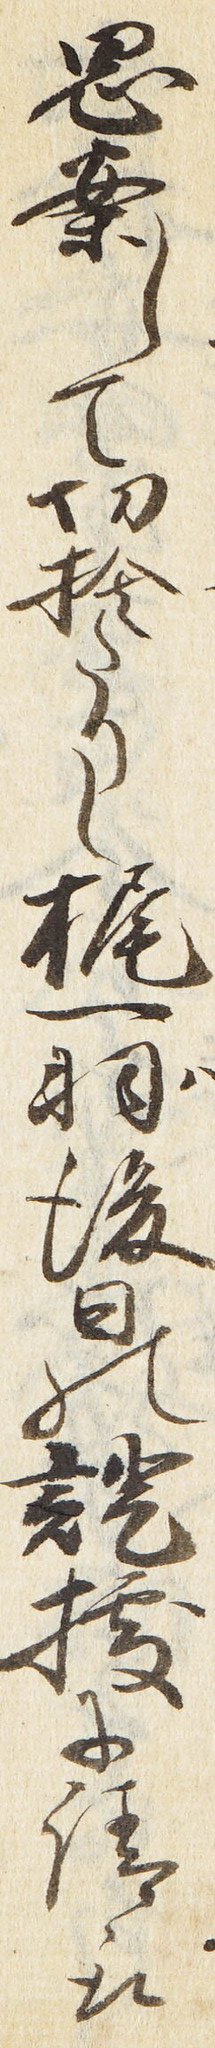思案して切捨たりし梶一羽後日の証拠に請取
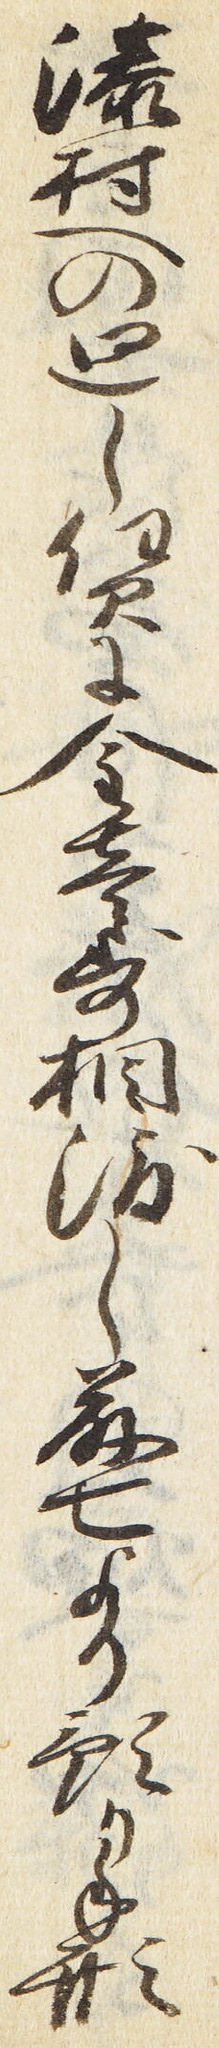湊村への廻し賃に金壱歩相渡し藤七より預り手形
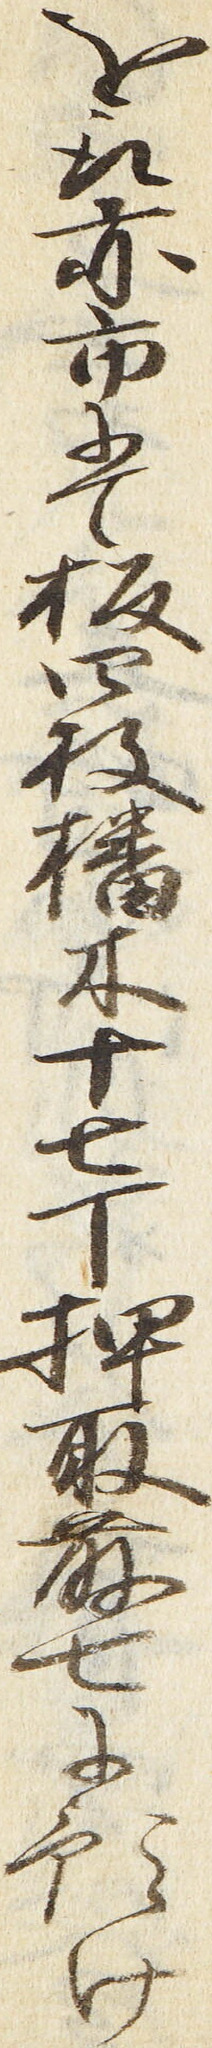を取亦市にて板四枚橎木十七丁押取藤七に預け
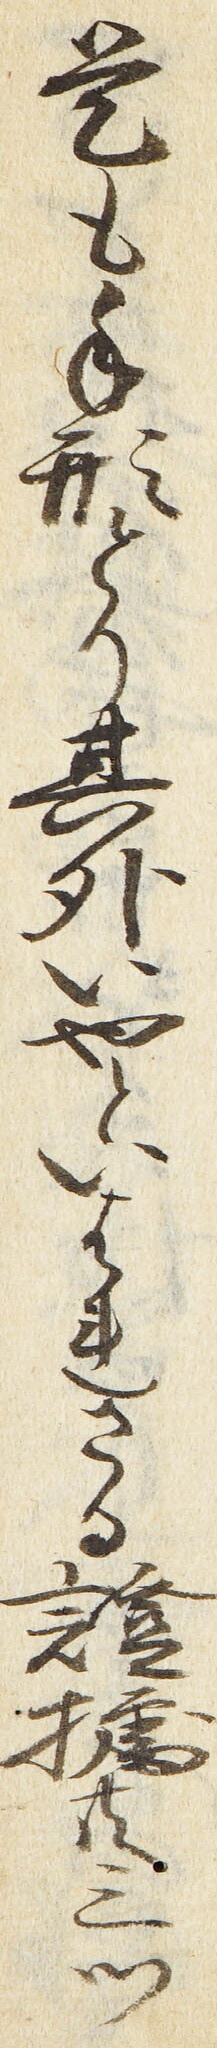是も手形とり其外いやといはれさる証拠共三ツ

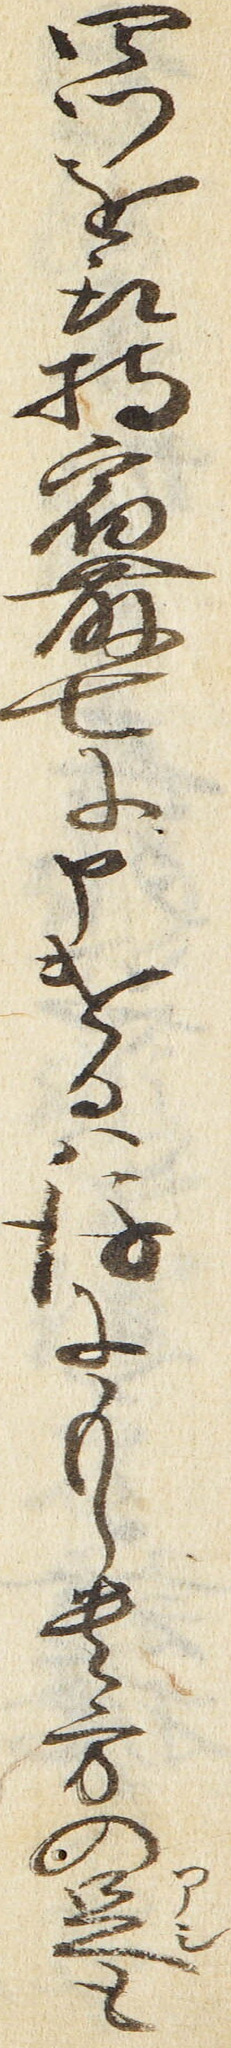四ツを取持宿藤七に申けるは後にもし貴方の足も
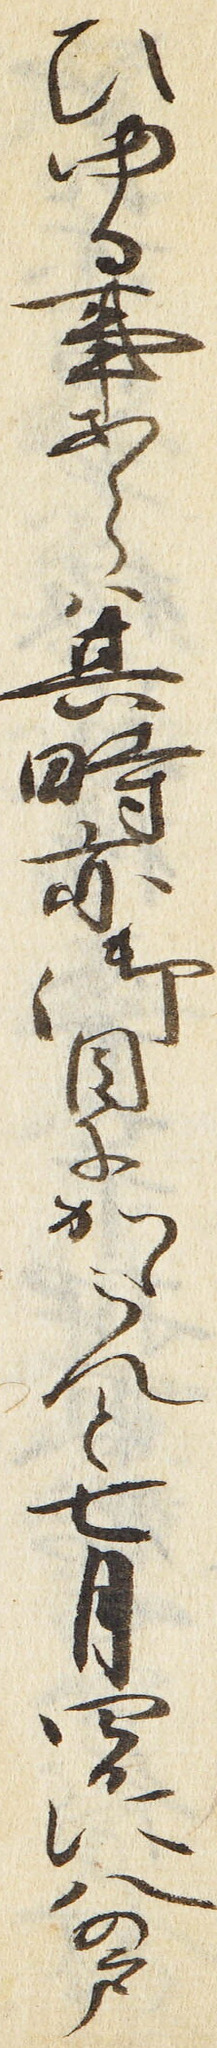ひ申る事あらは其時亦御目にかゝらんと七月四日に八の戸
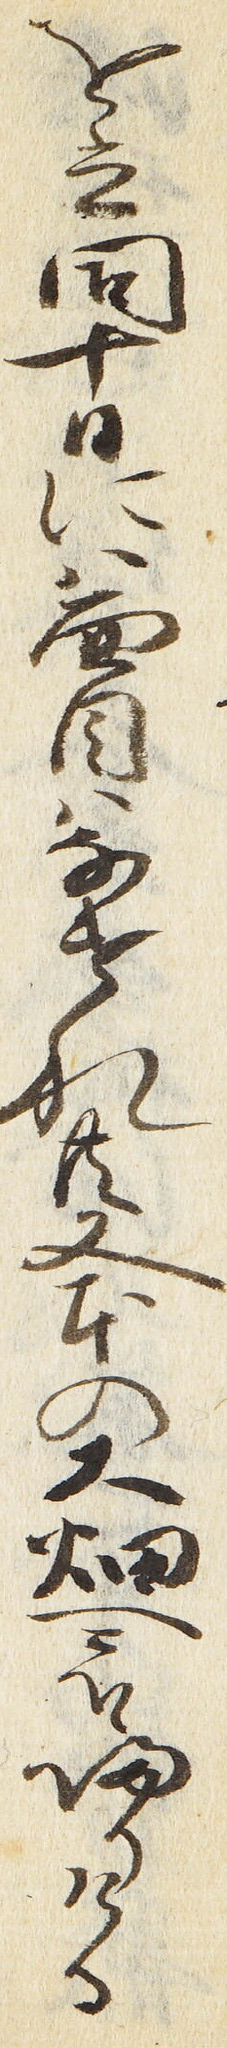を去同十日には面目はなけれ共又本の大畑へこそ帰りける
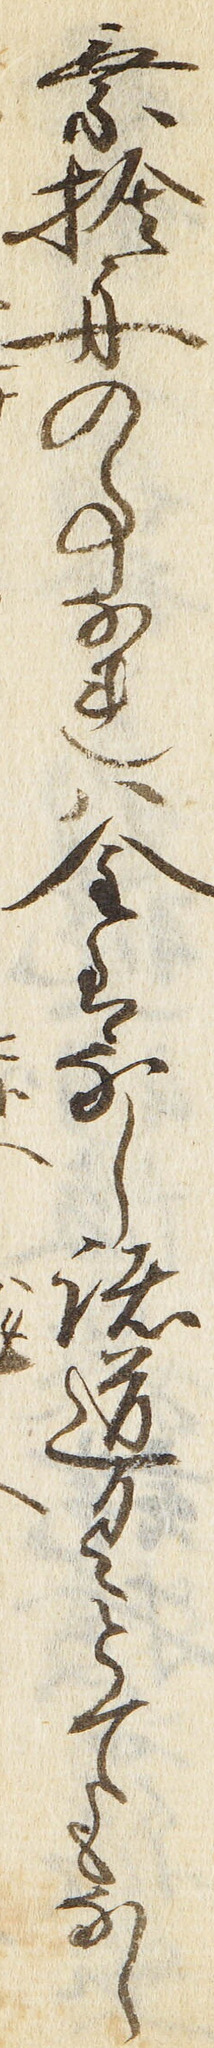乗捨舟の事なれは金はなし諸道具とてもなし
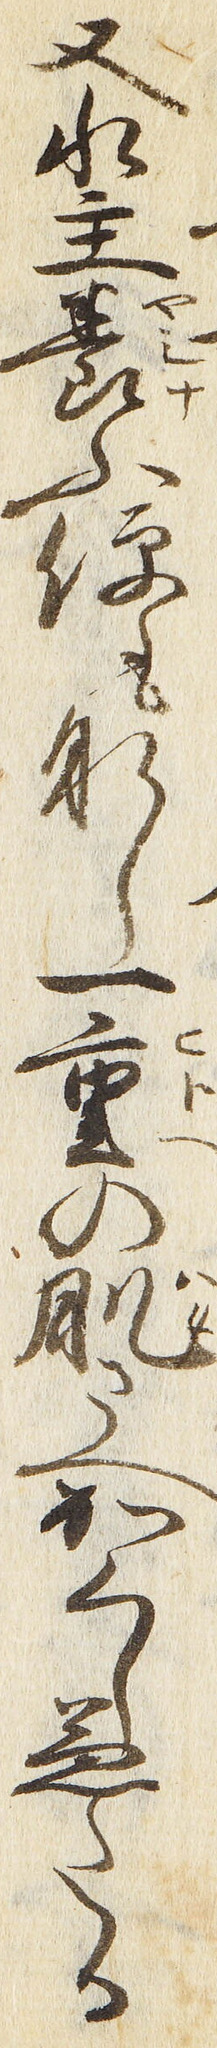又水主養ふ便もなし一重の肌さへかくし兼たる
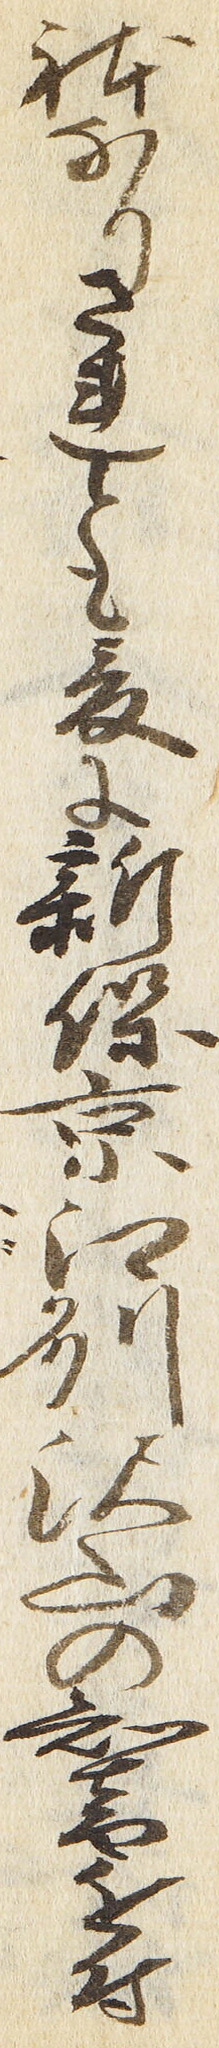体なりされとも爰に新保京江州沢山の知音近付
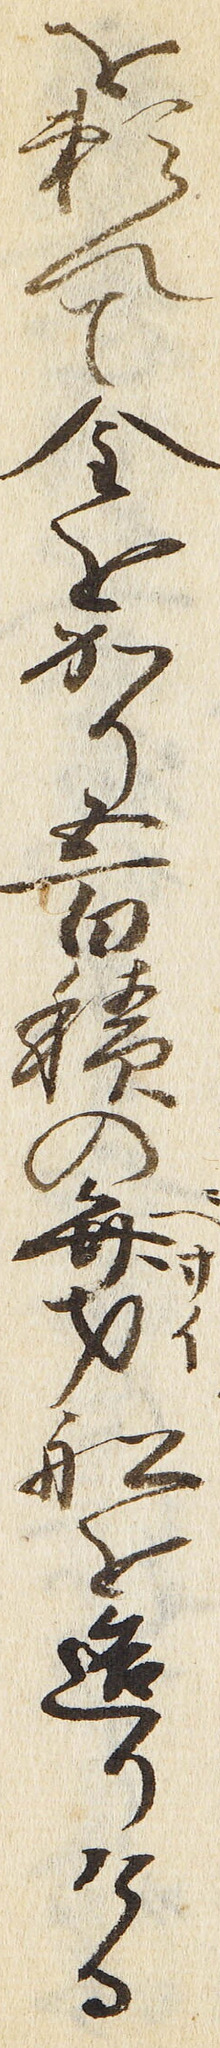を頼んて金をかり五百積の弁才船を造りける
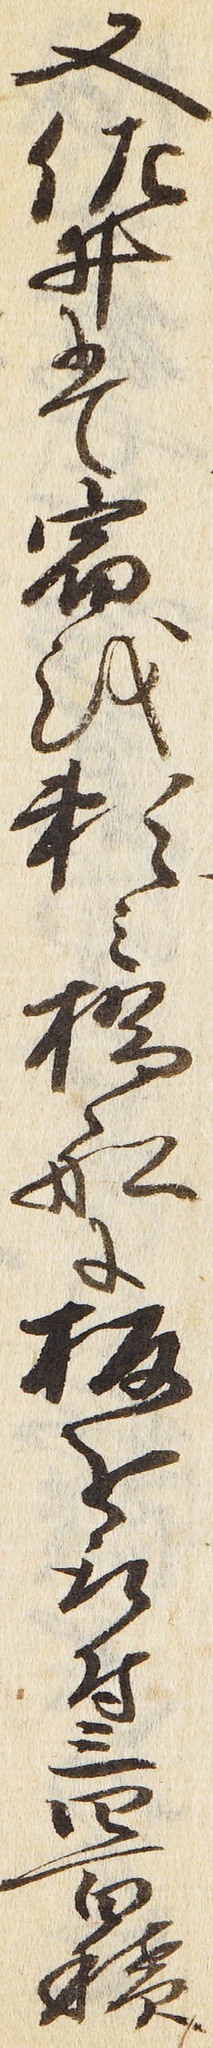又佐竹にて宿を頼み橋船に板を取付三四百積
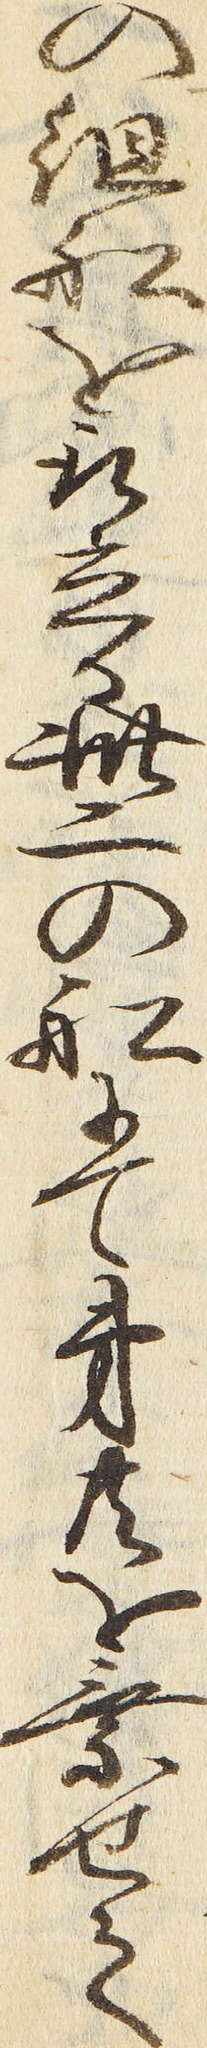の組船を取立る此二の船にて弟共を乗せて
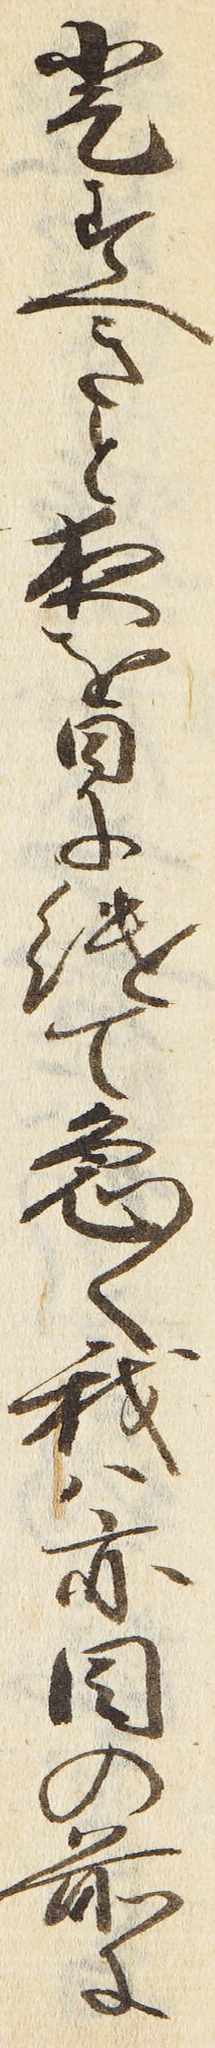登すへきと夜を日に継て急く我は亦目の前に
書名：海陸世話日記
